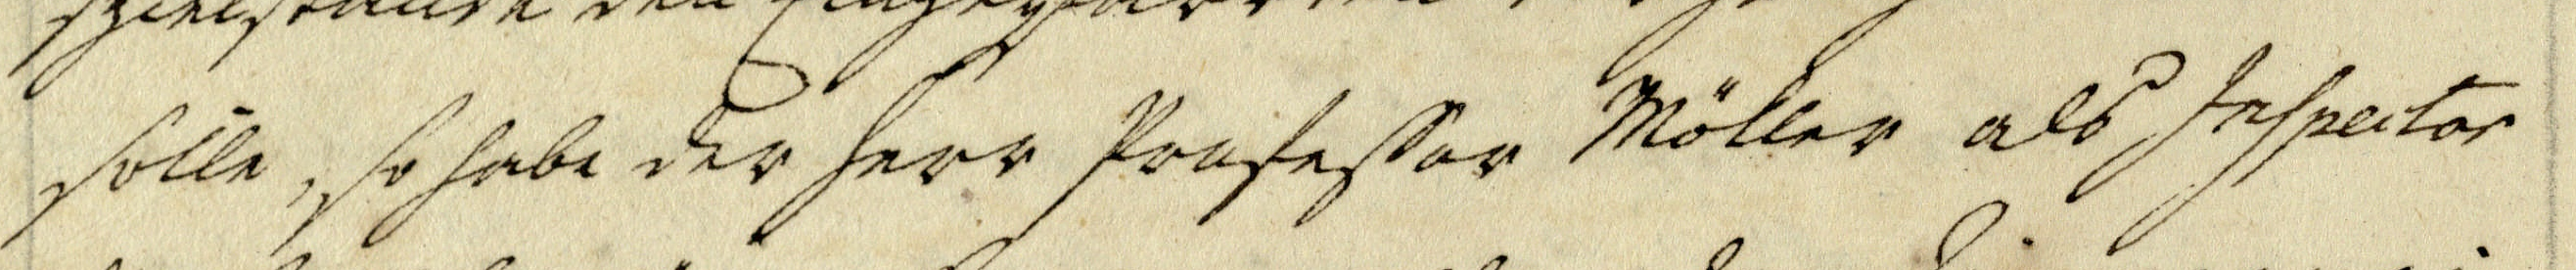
solle, so habe der Herr Professor Möller als Inspector
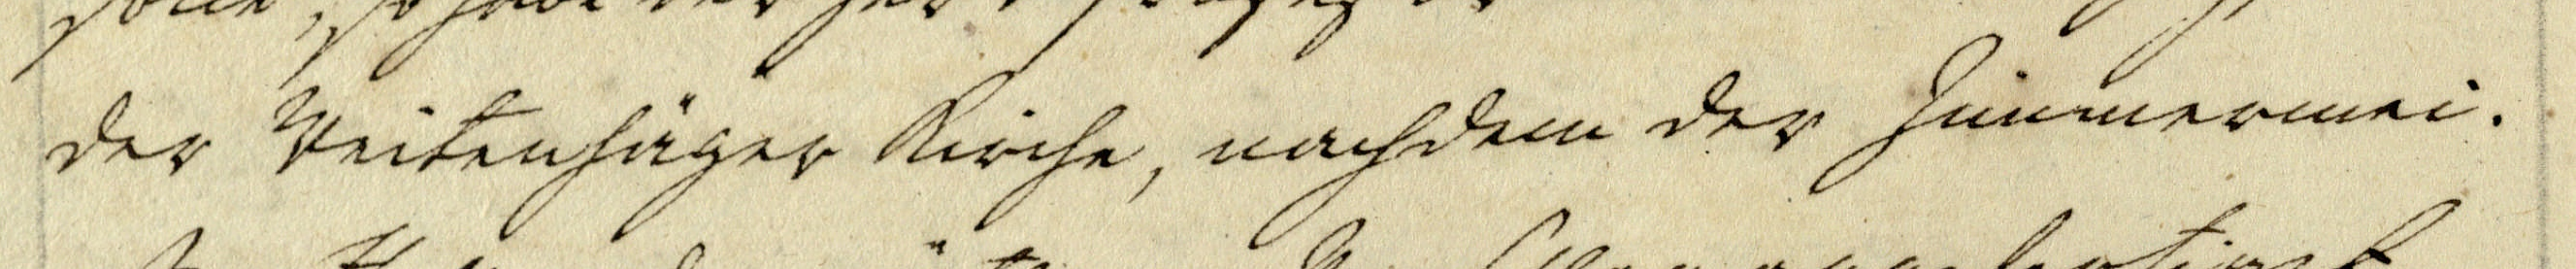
der Weitenhäger Kirche, nachdem der Zimmermei¬
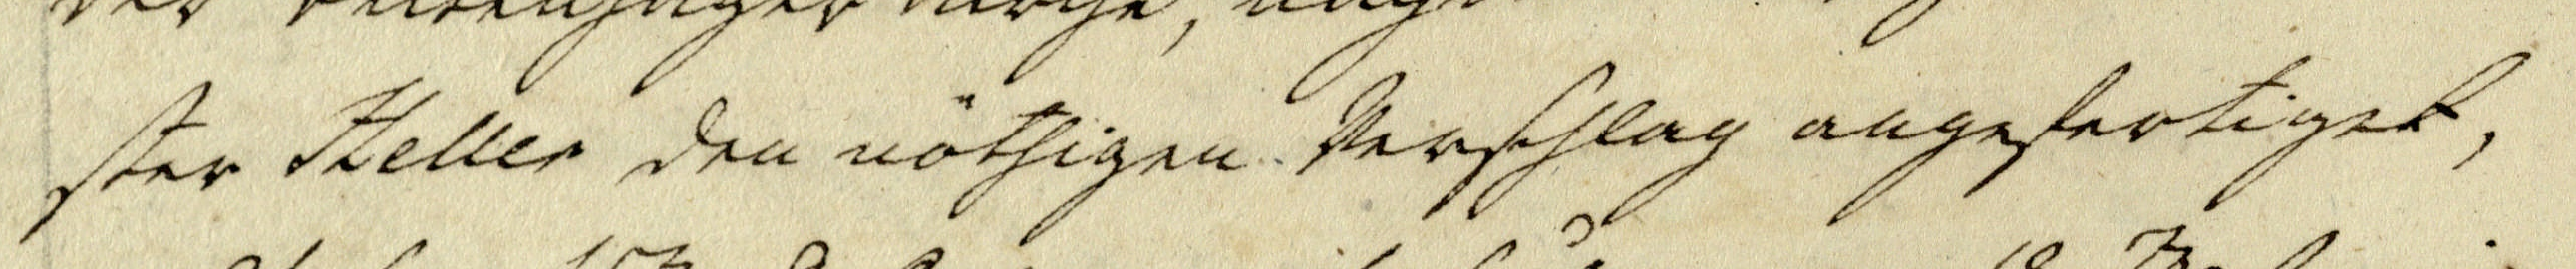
ster Heller den nöthigen Verschlag angefertiget,
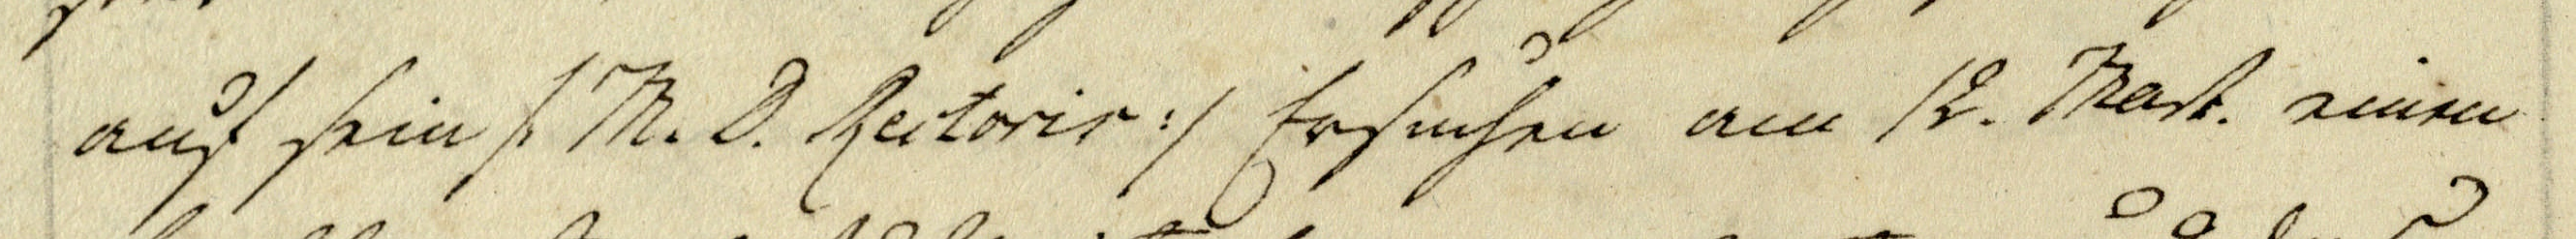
auf sein /. M. D. Rectoris :/ Ersuchen am 12. Mart. einen
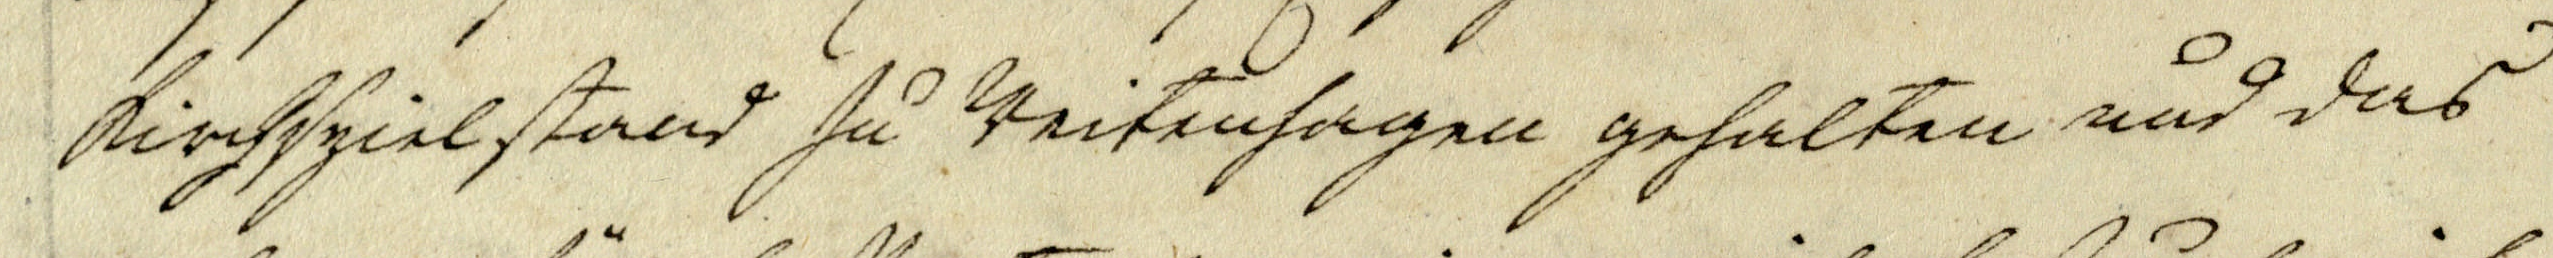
Kirchspielstand zu Weitenhagen gehalten und das
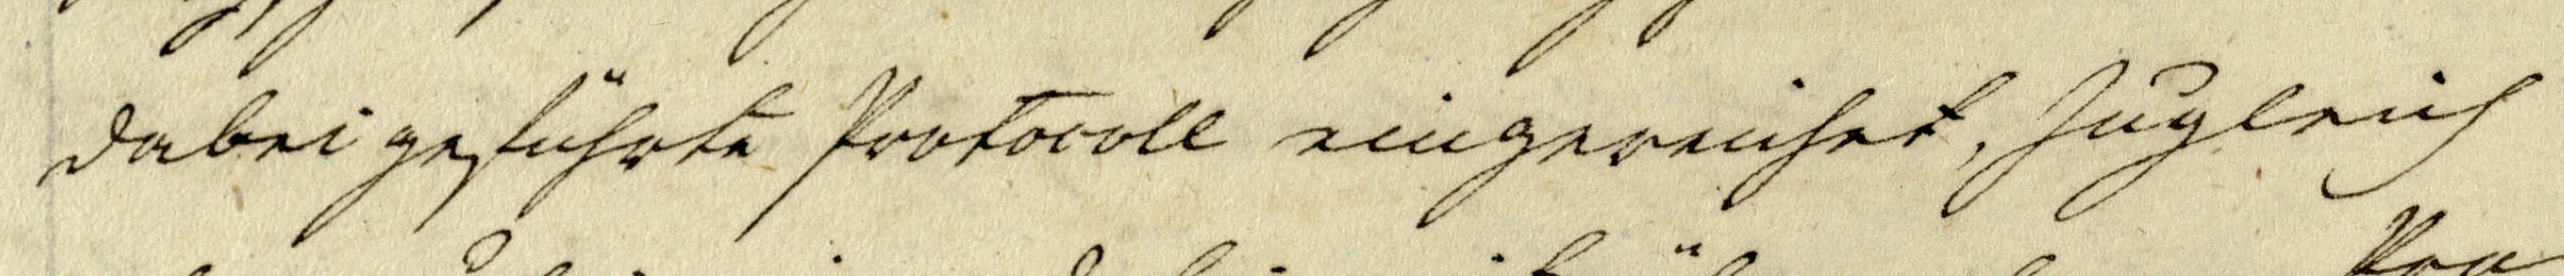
dabei geführte Protocoll eingereichet, zugleich
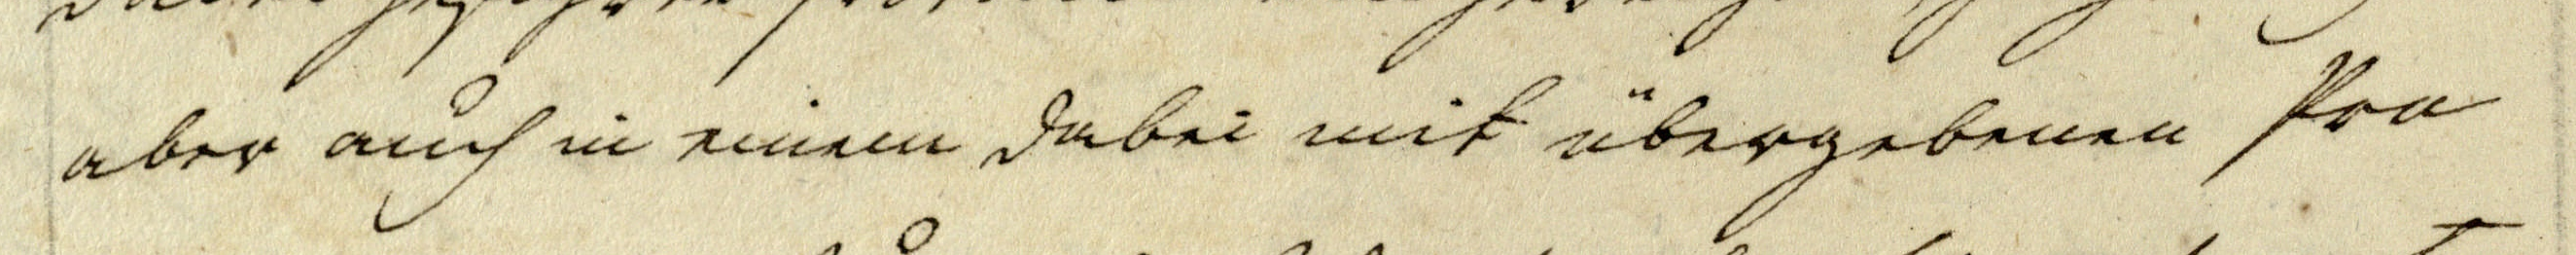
aber auch in einem dabei mit übergebenen Pro¬
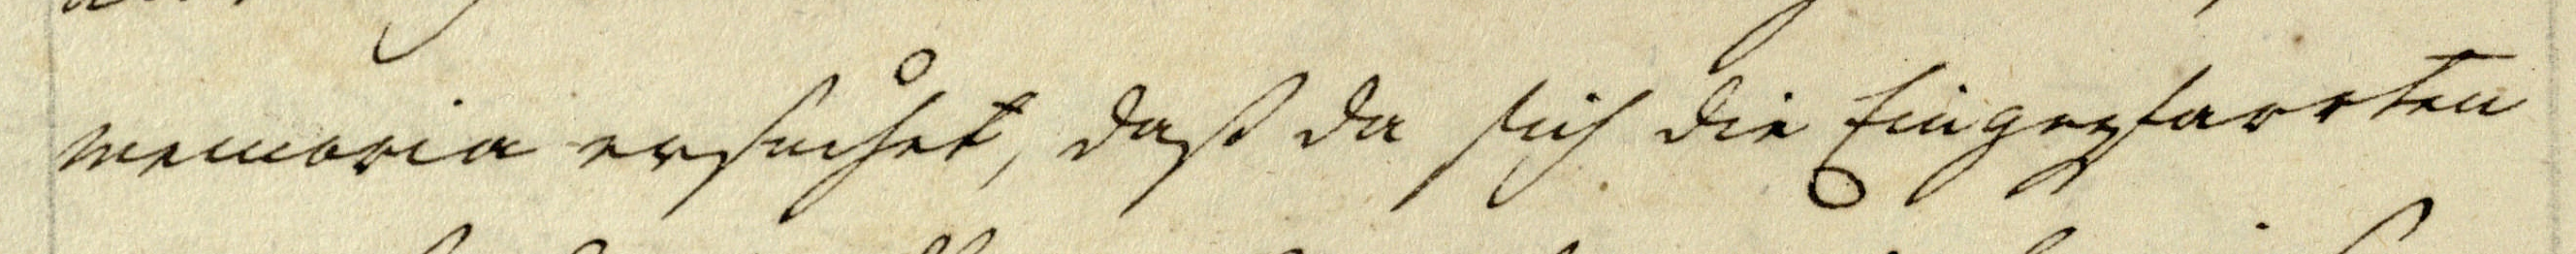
memoria ersuchet, daß da sich die Eingepfarrten
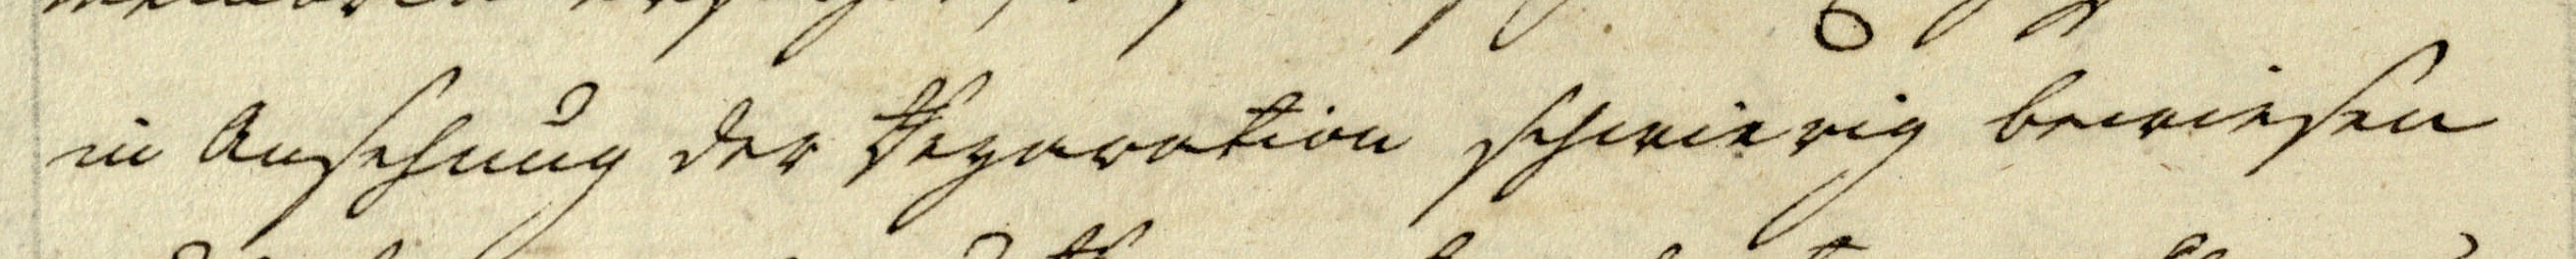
in Ansehung der Reparation schwierig bewiesen
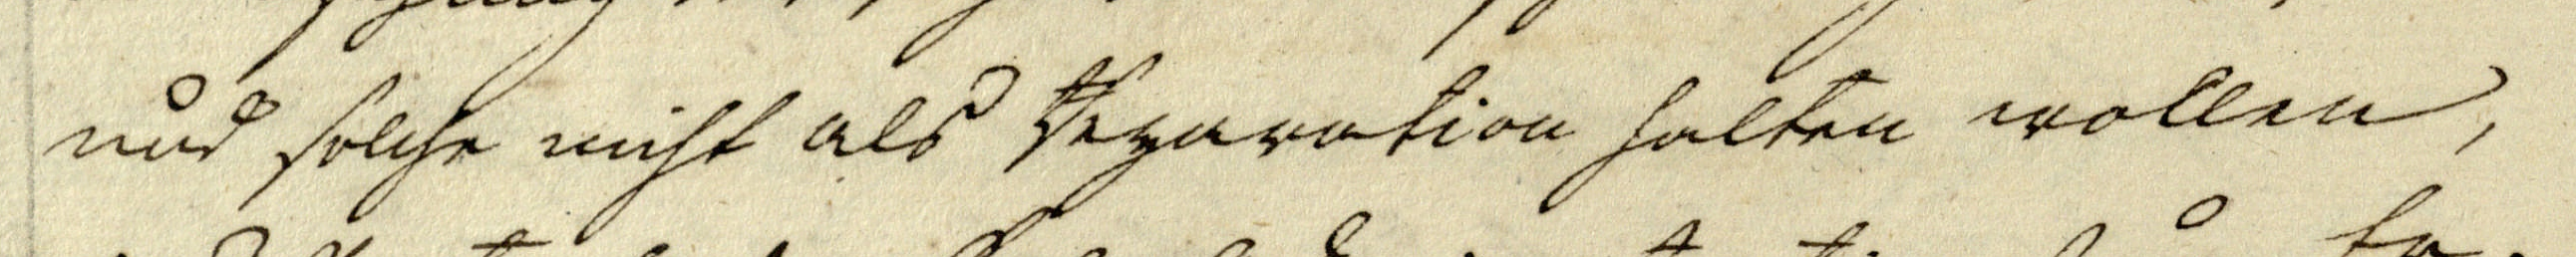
und solche nicht als Reparation halten wollen,
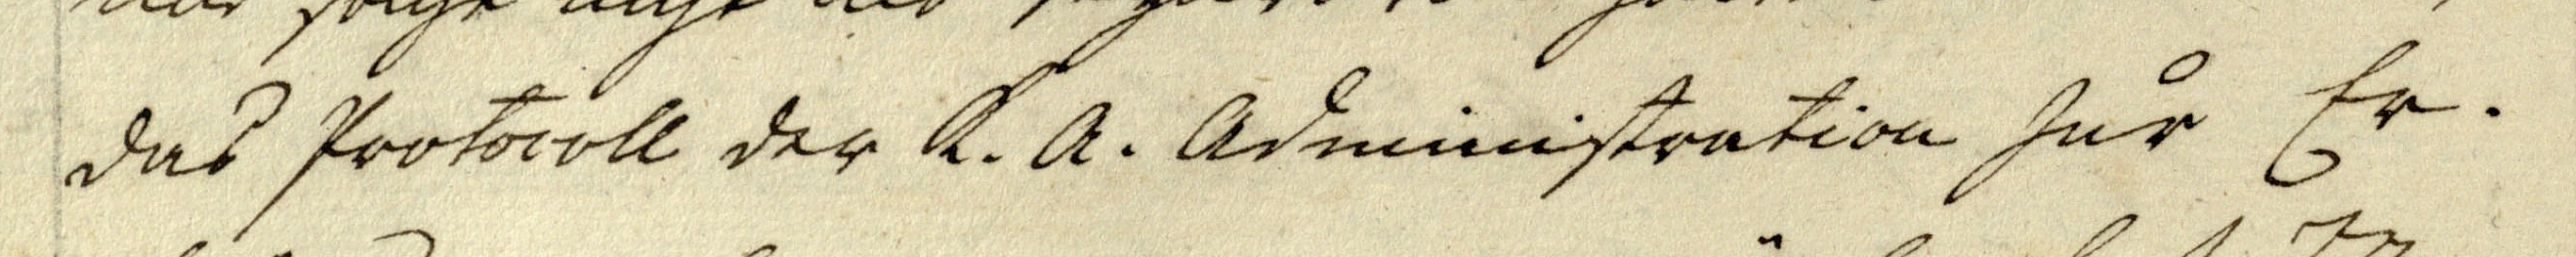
das Protocoll der K. A. Administration zur Er¬
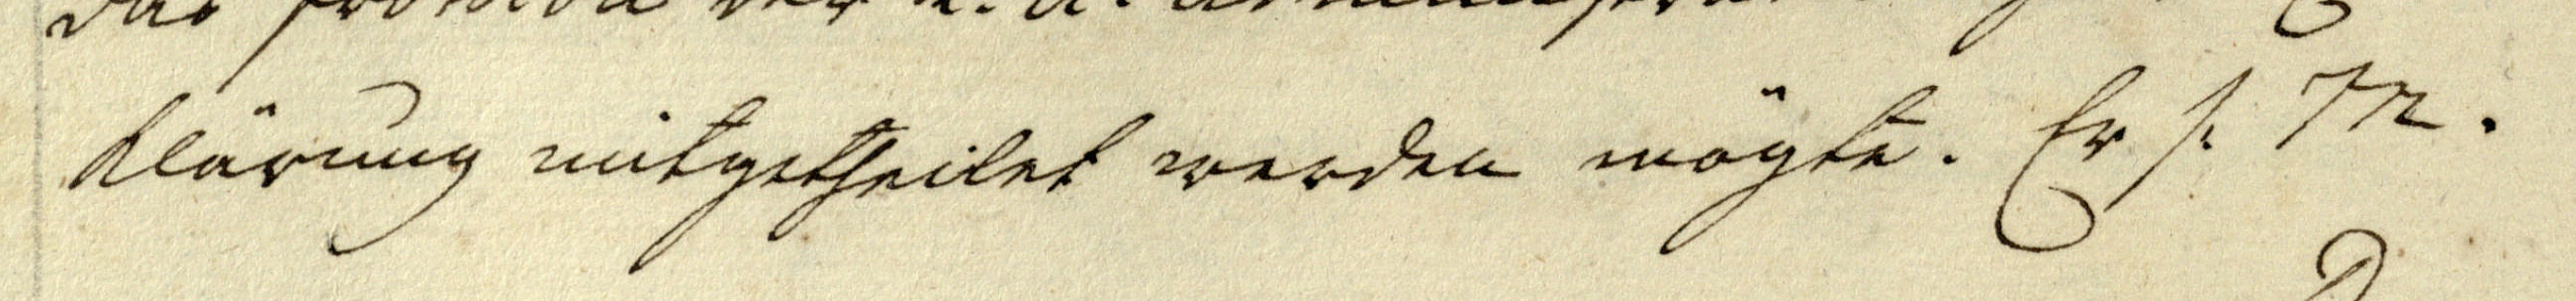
klärung mitgetheilet werden mögte. Er /. M.
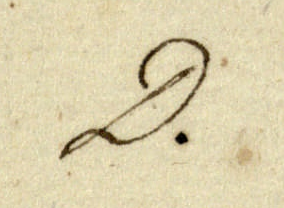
D.
